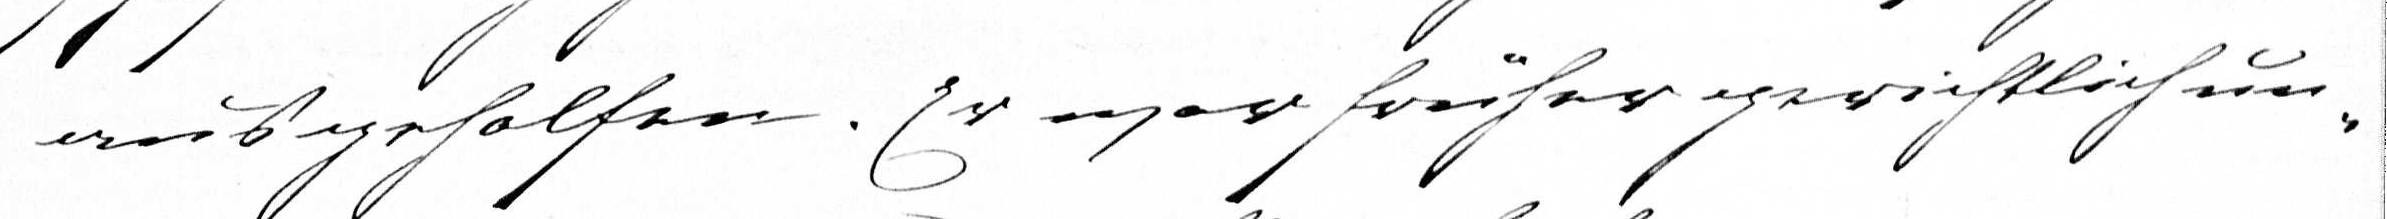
ausgeholfen. Er war früher gerichtlich un¬
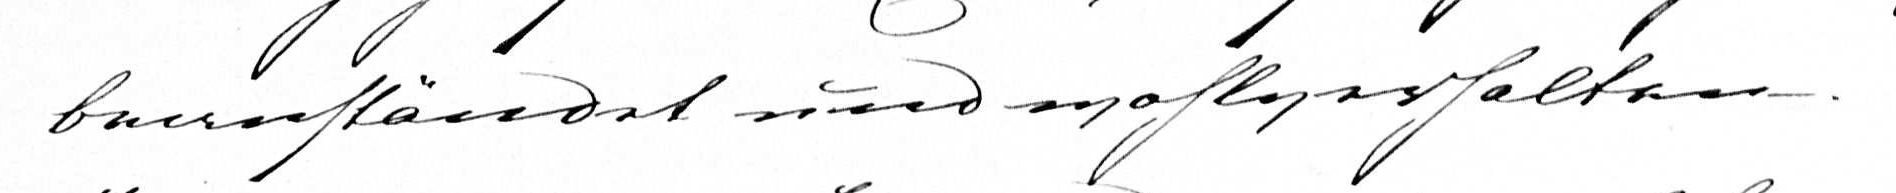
beanständet und wohlverhalten.
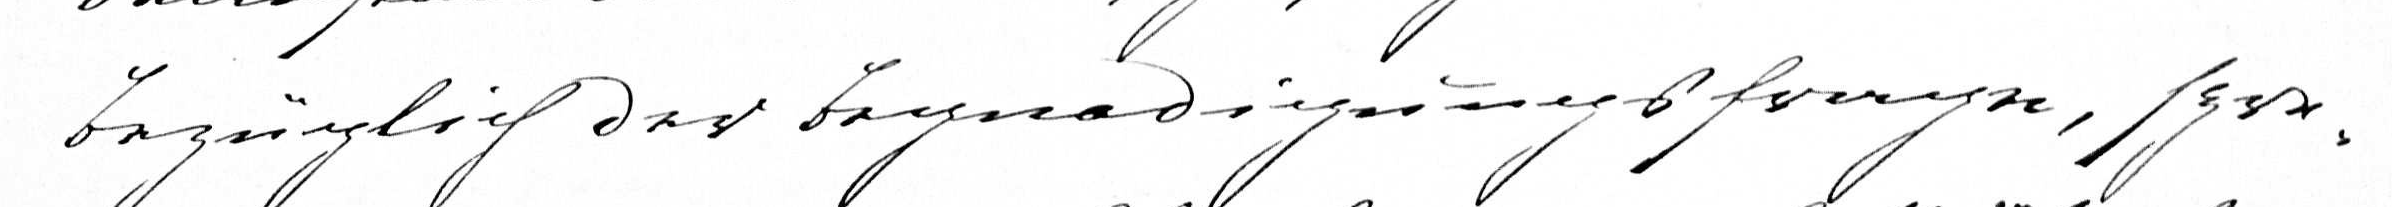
Bezüglich der Begnadigungsfrage, spre¬
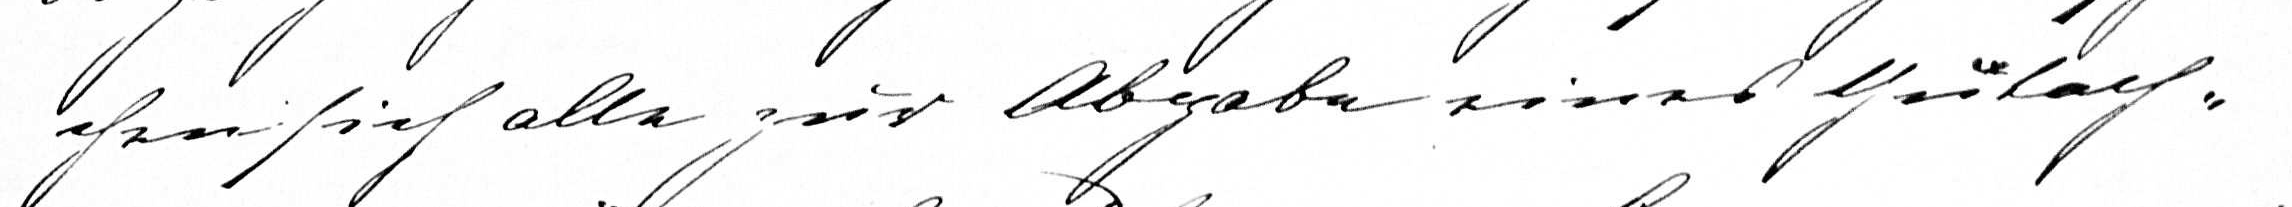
chen sich alle zur Abgabe eines Gutach¬
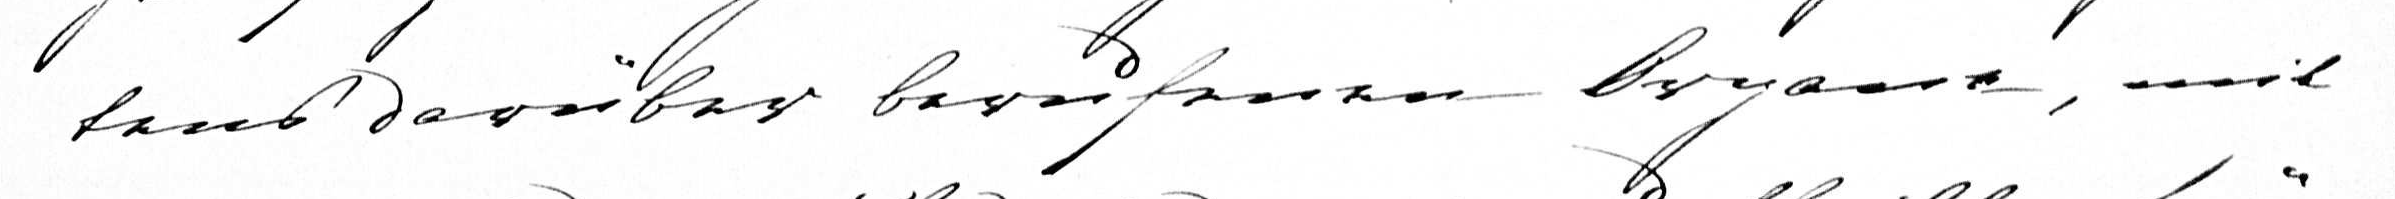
tens darüber berufenen Organe, mit
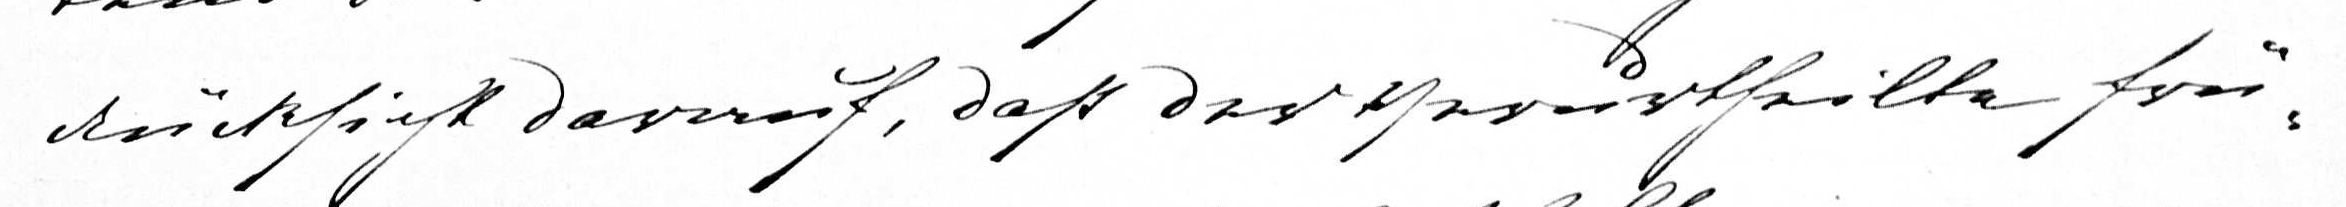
Rücksicht darauf, daß der Verurtheilte frü¬
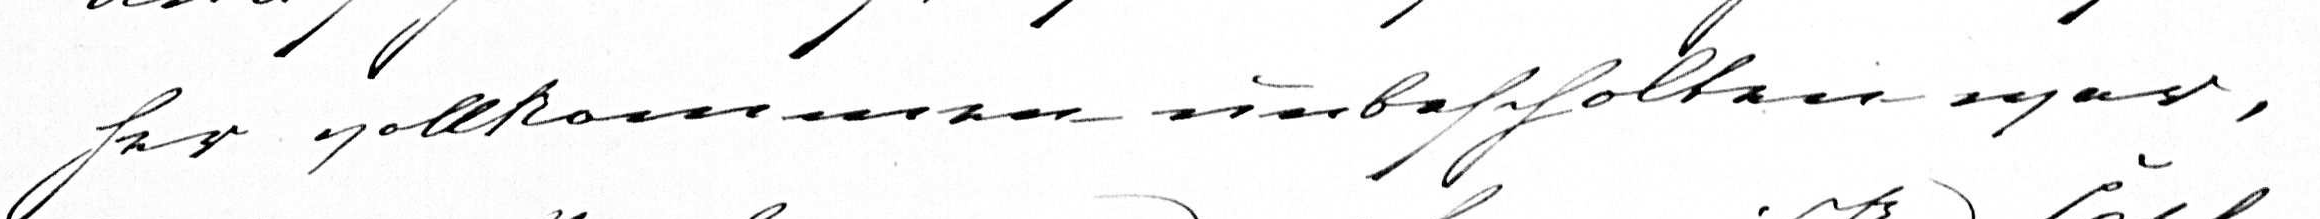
her vollkommen unbescholten war,
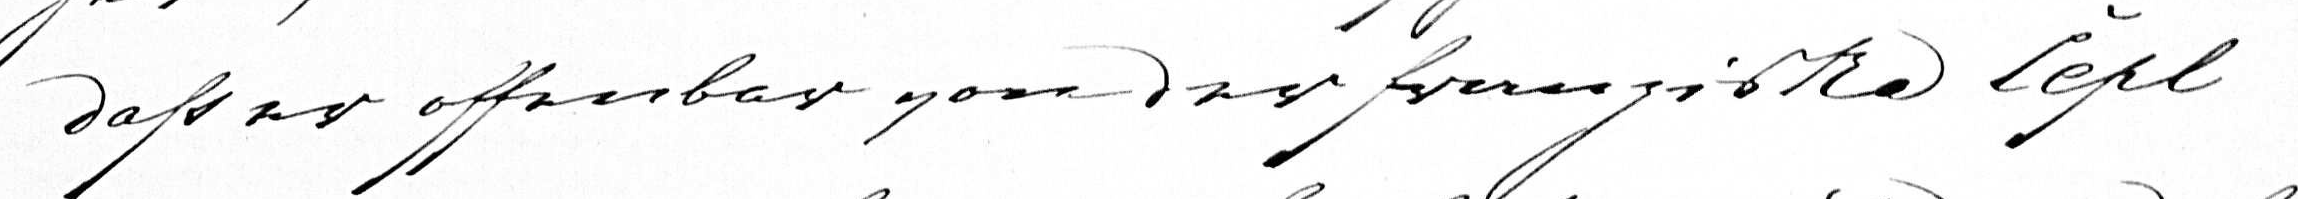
daß er offenbar von der Franziska Čepl
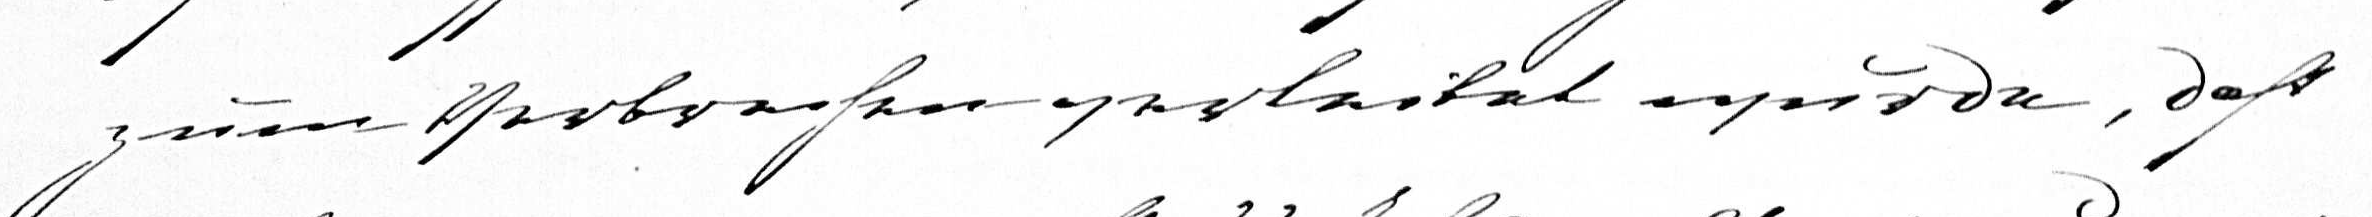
zum Verbrechen verleitet wurde, daß
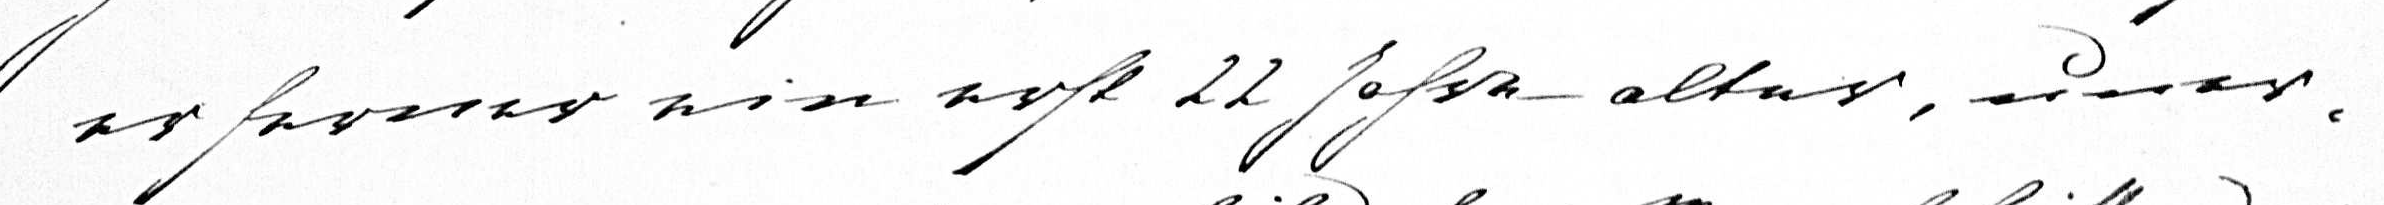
er ferner ein erst 22 Jahre alter, uner¬
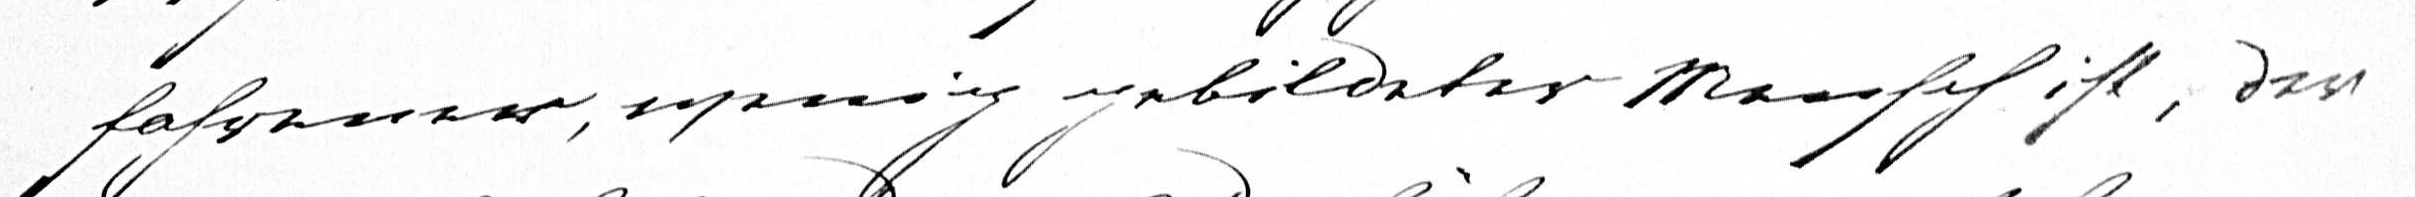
fahrener, wenig gebildeter Mensch ist, der
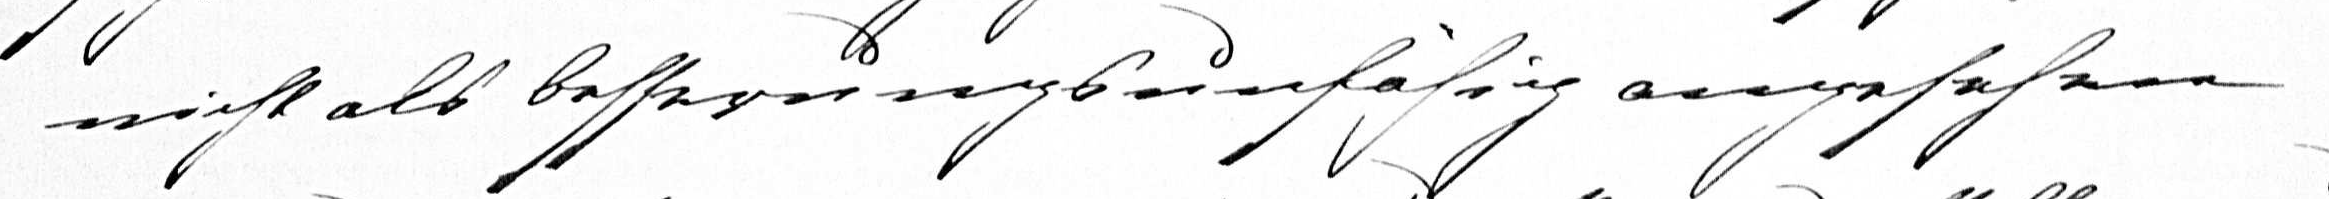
nicht als besserungsunfähig angesehen
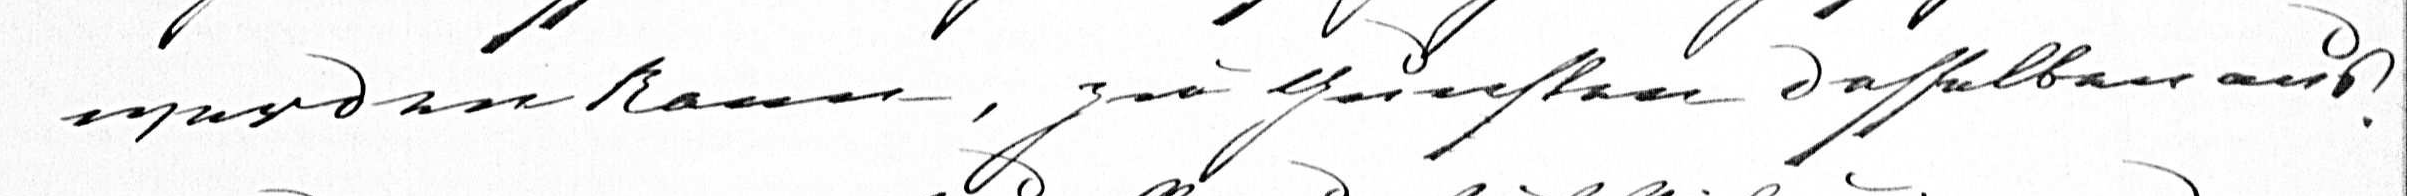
werden kann, zu Gunsten dasselben aus.
